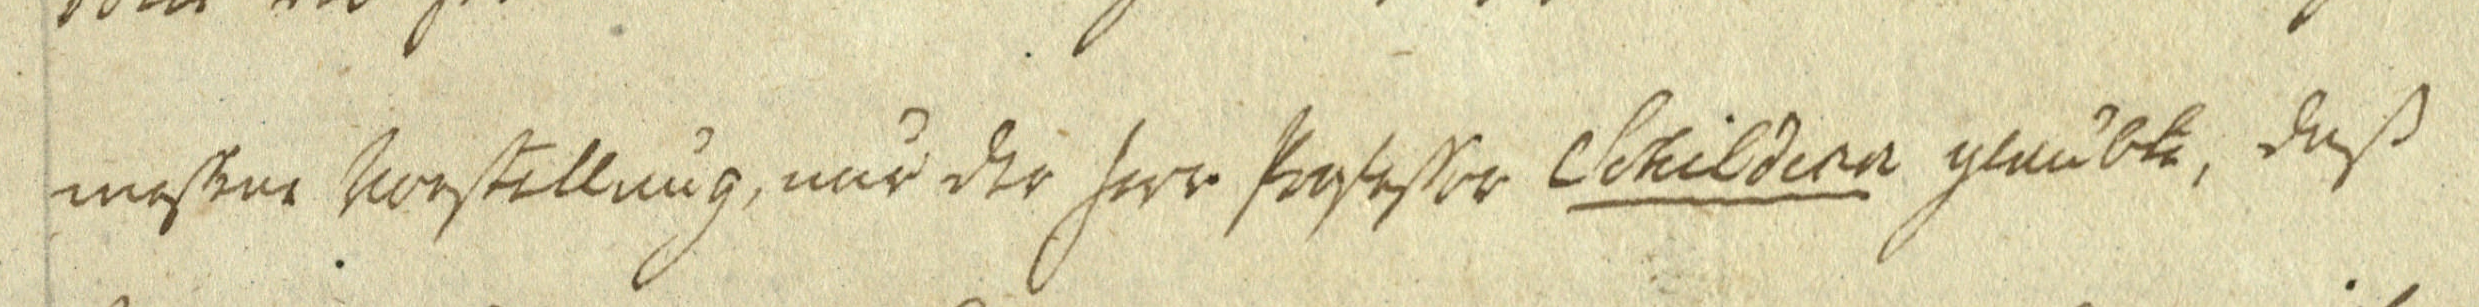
messene Vorstellung, nur der Herr Professor Schildener glaubte, daß
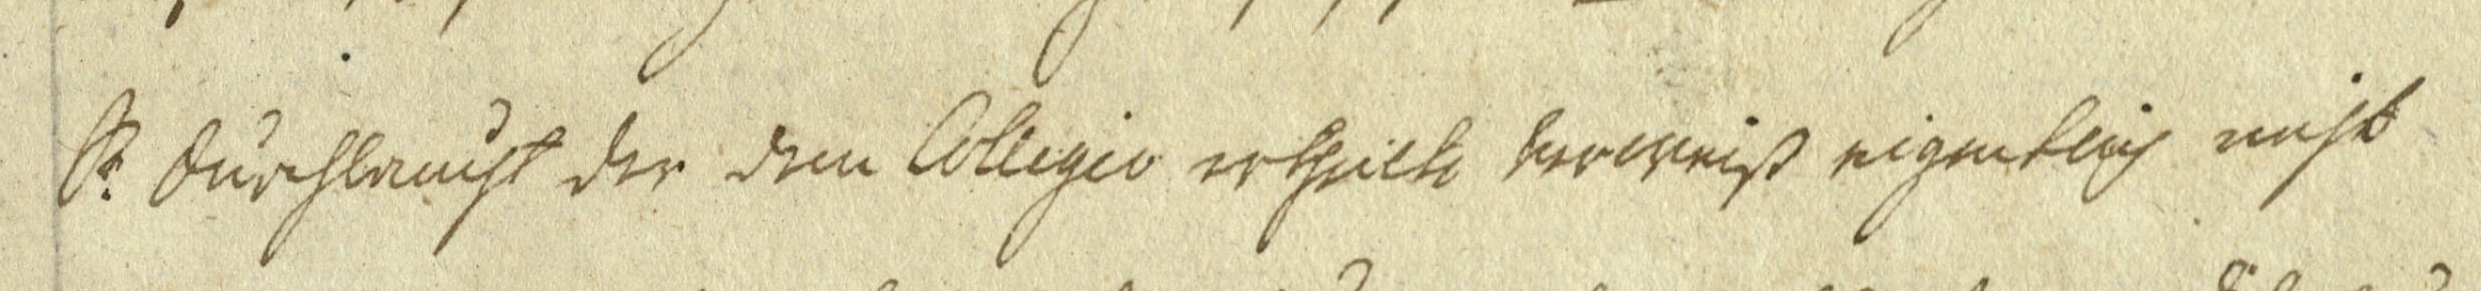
Sr. Durchlaucht der dem Collegio ertheilte Verweis eigentlich nicht
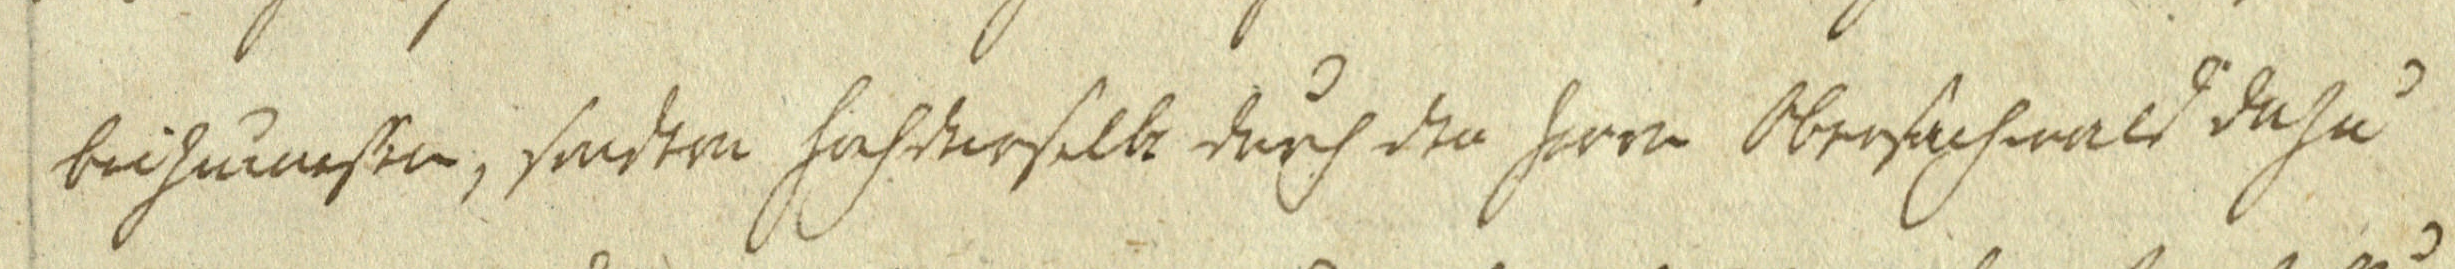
beizumessen, sondern hochderselbe durch den Herrn Obersachwald dazu
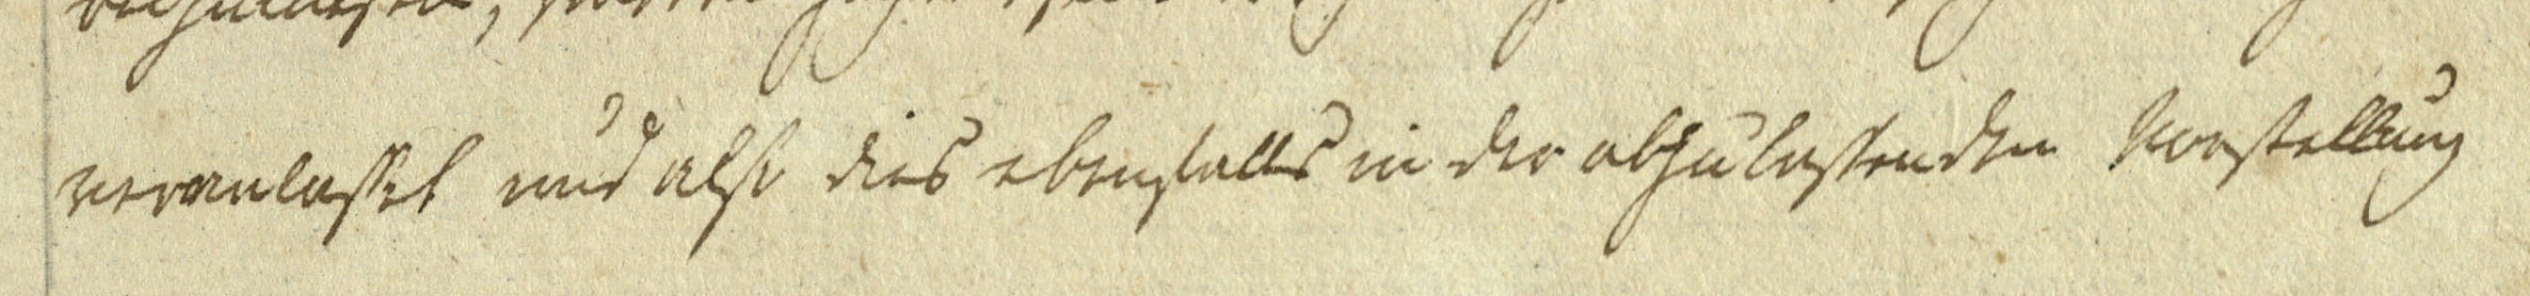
veranlasset und also dies ebenfalls in der abzulassenden Vorstellung
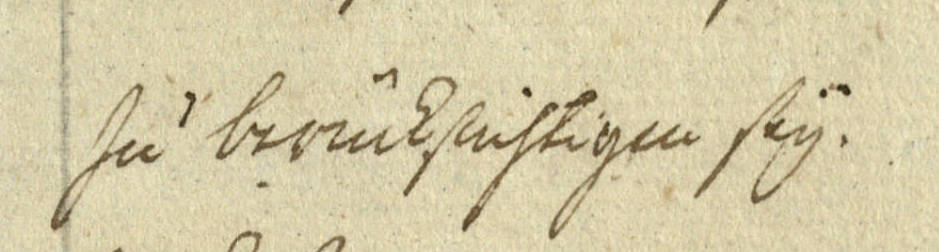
zu berücksichtigen seÿ.
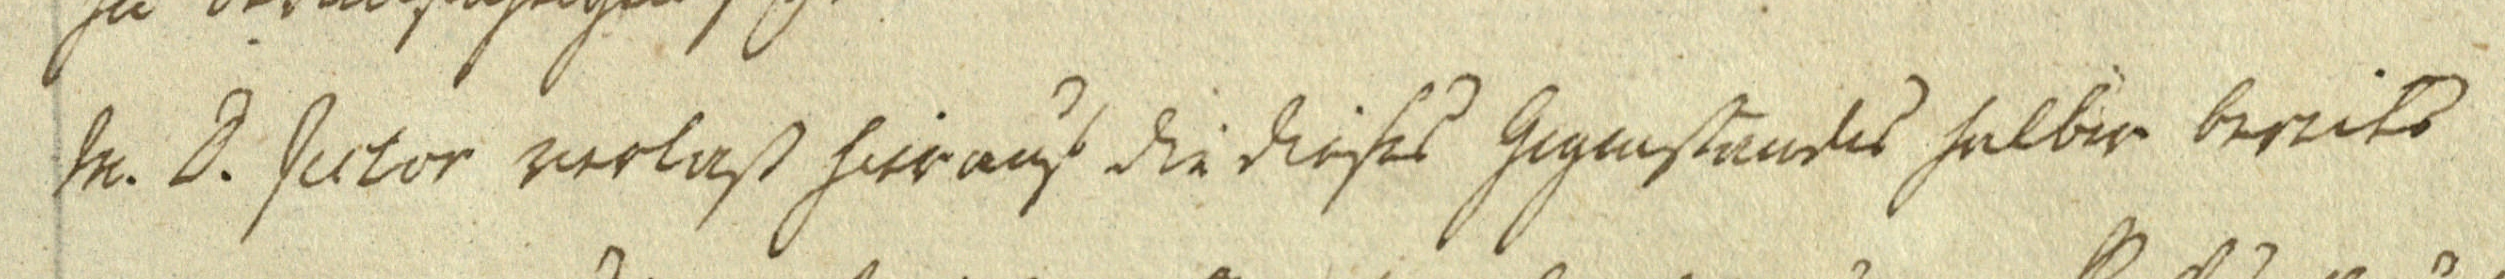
M. D. Rector verlaß hierauf die dieses Gegenstandes halber bereits
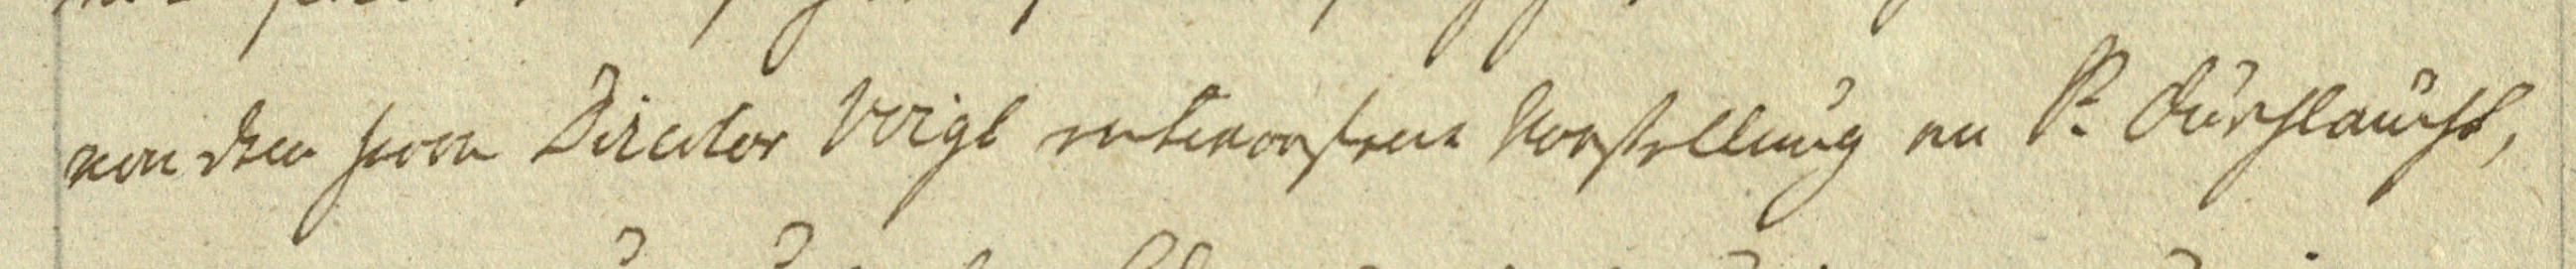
von dem Herrn Director Voigt entworfene Vorstellung an Sr. Durchlaucht,
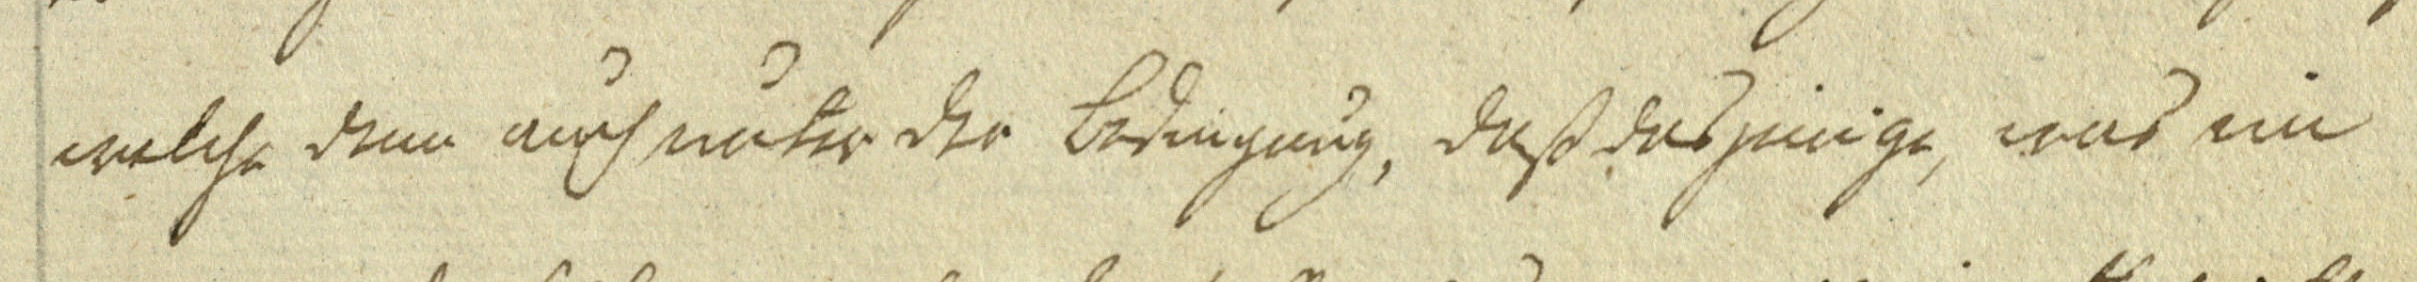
welche denn auch unter der Bedingung, daß dasjenige, was im
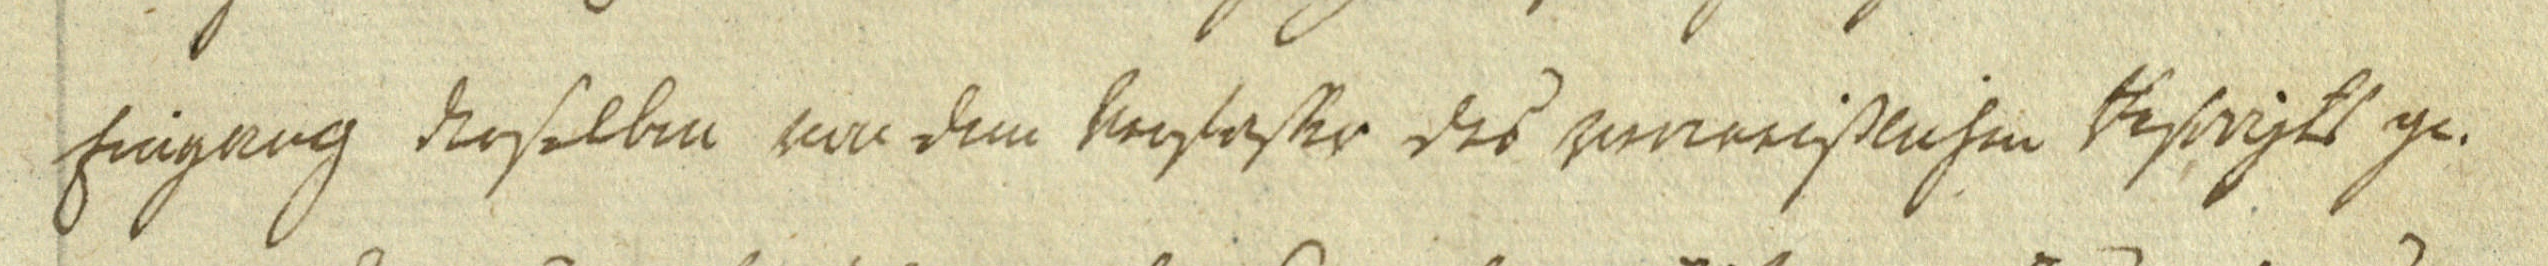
Eingang derselben von dem Verfasser des verweislichen Rescripts ge¬
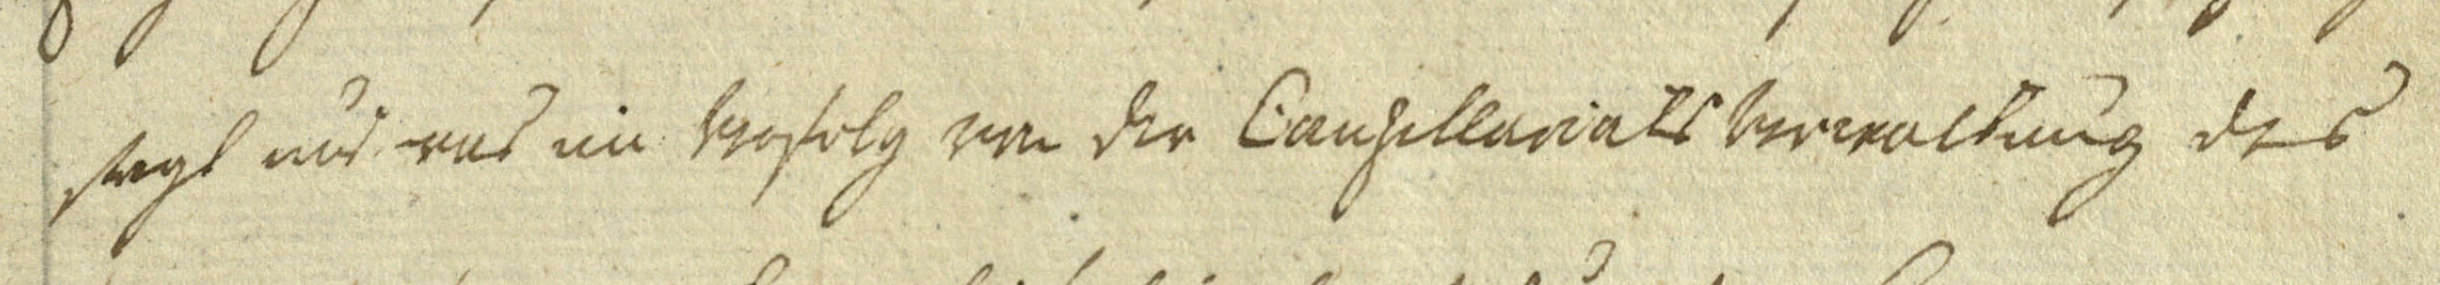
fragt und was in Verfolg von der Canzellariats Verwaltung des
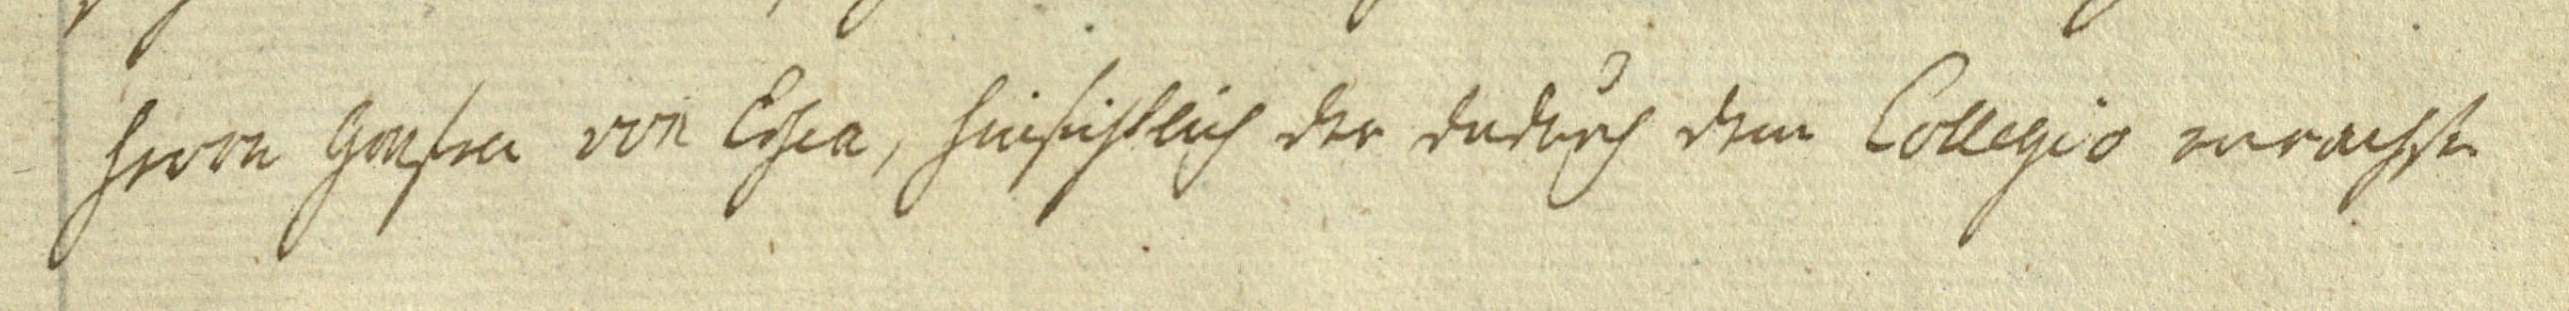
Herrn Grafen von Essen, hinsichtlich der dadurch dem Collegio erwachse¬
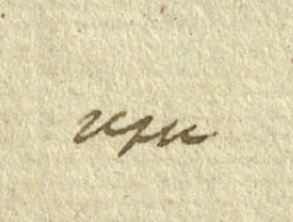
nen
